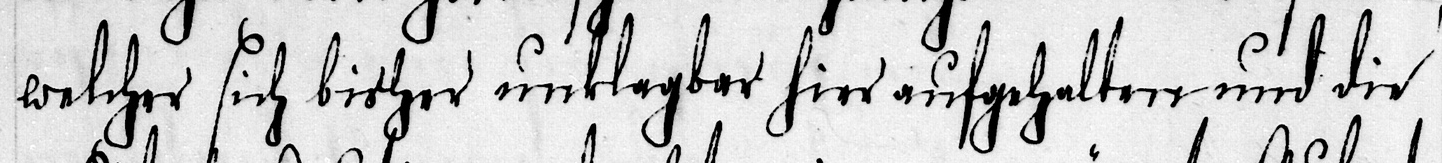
welcher sich bisher unklagbar hier aufgehalten und die
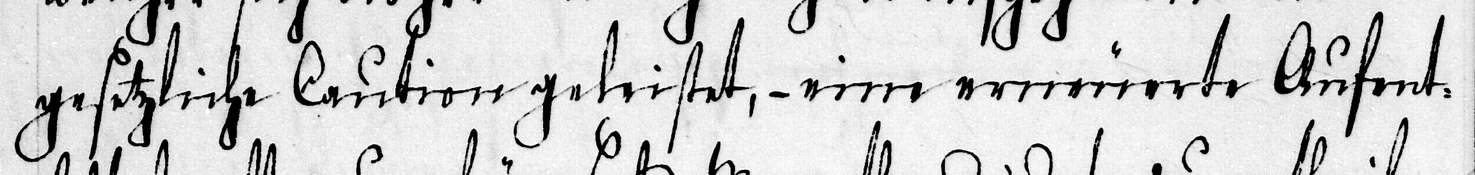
gesetzliche Caution geleistet, – eine erneuerte Aufent¬
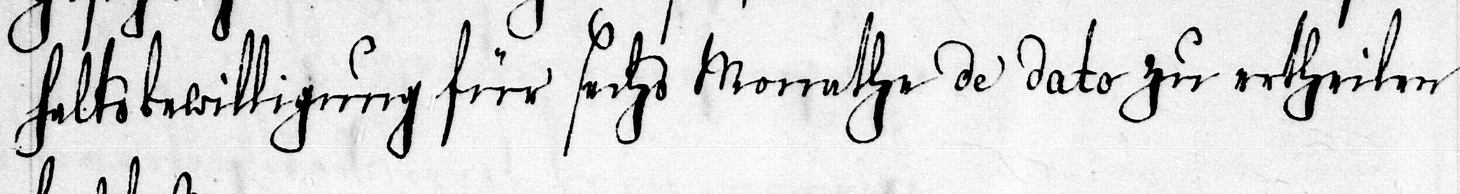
haltsbewilligung für sechs Monathe de dato zu ertheilen
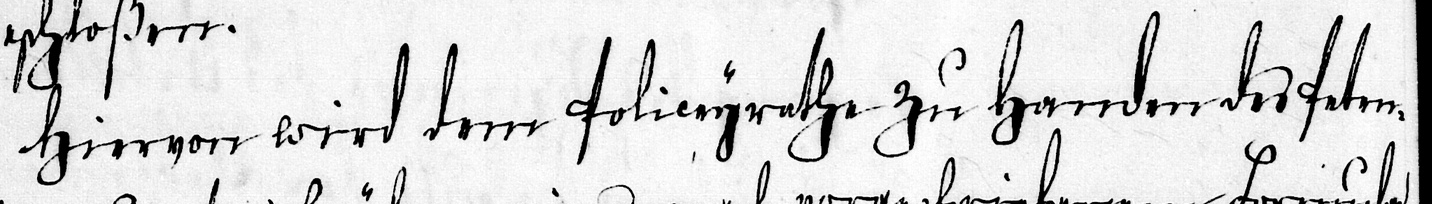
Hiervon wird dem Policeyrathe zu Handen des Peten¬
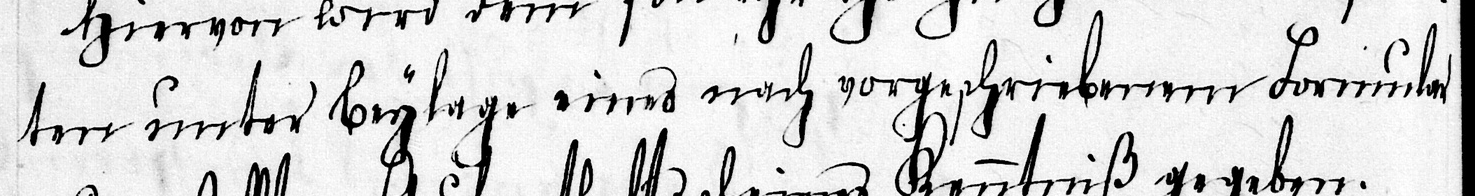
ten unter Beylage eines nach vorgeschriebenem Formular
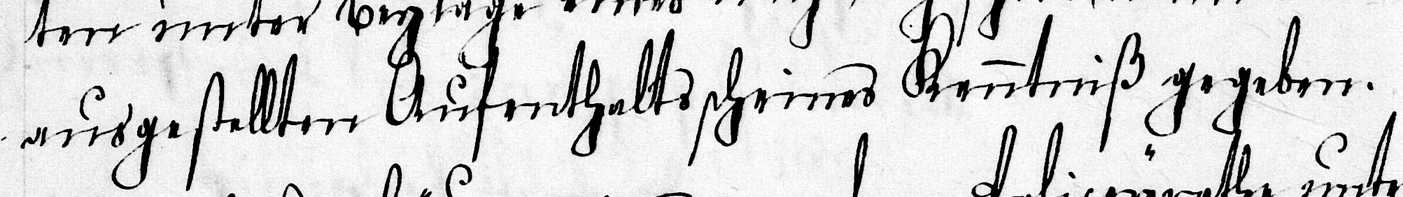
ausgestellten Aufenthaltsscheines Kenntniß gegeben.
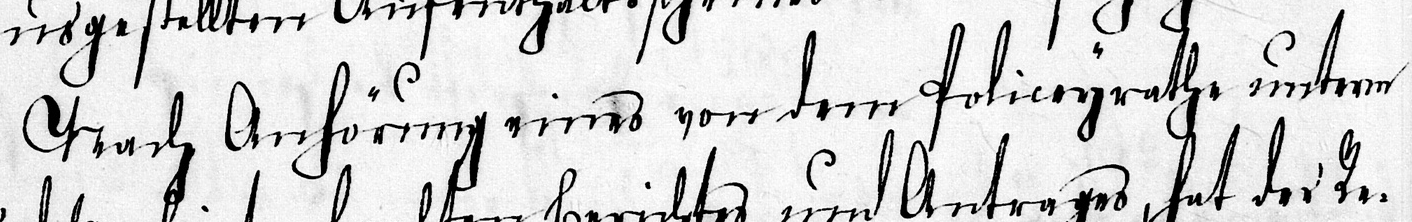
Nach Anhörung eines von dem Policeyrathe unterm
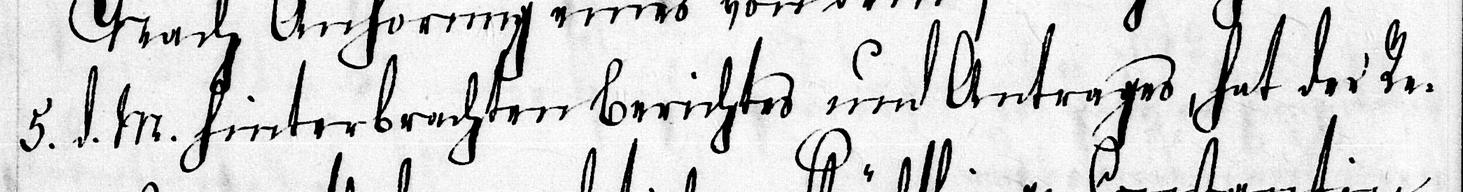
5. d. M. hinterbrachten Berichtes und Antrages, hat der Re¬
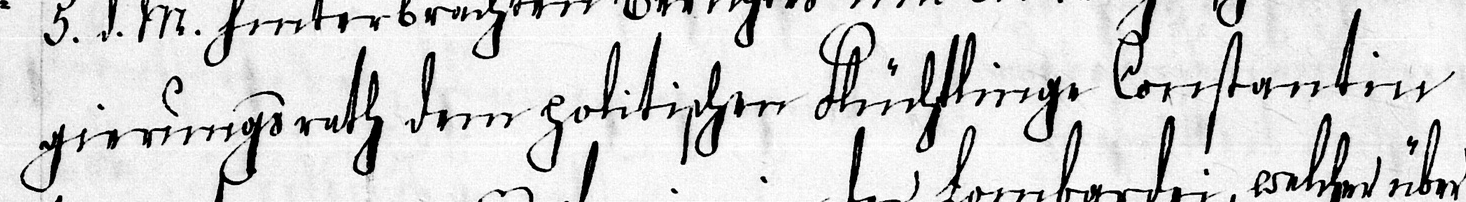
gierungsrath dem politischen Flüchtlinge Constantin
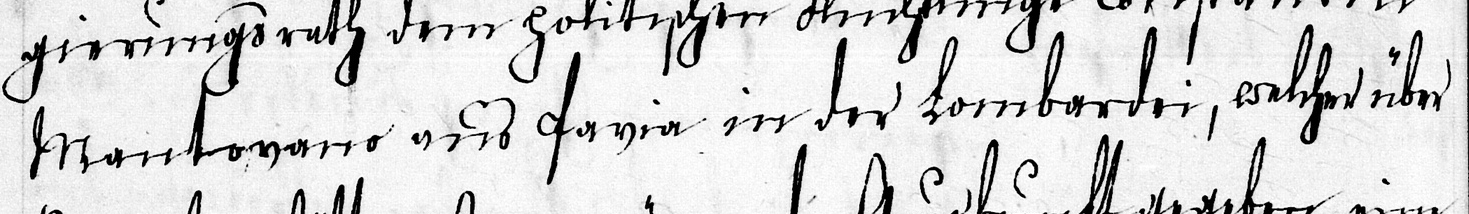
Mantovano aus Pavia in der Lombardei, welcher über
